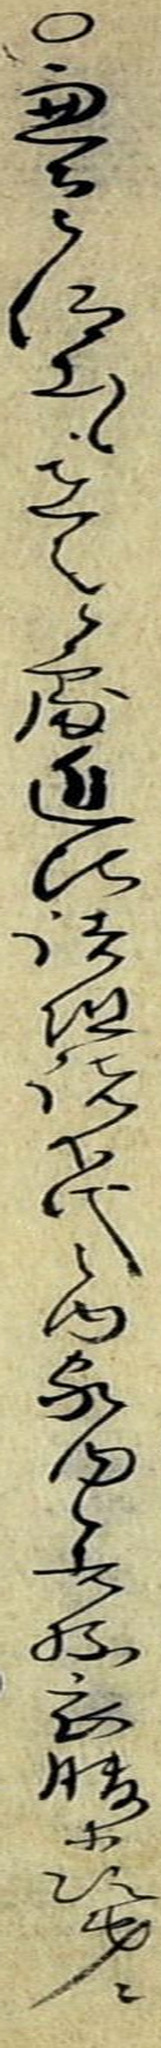〇兼而被仰出も在之候処近頃諸組諸下代之内家内之者抔衣服等次第ニ
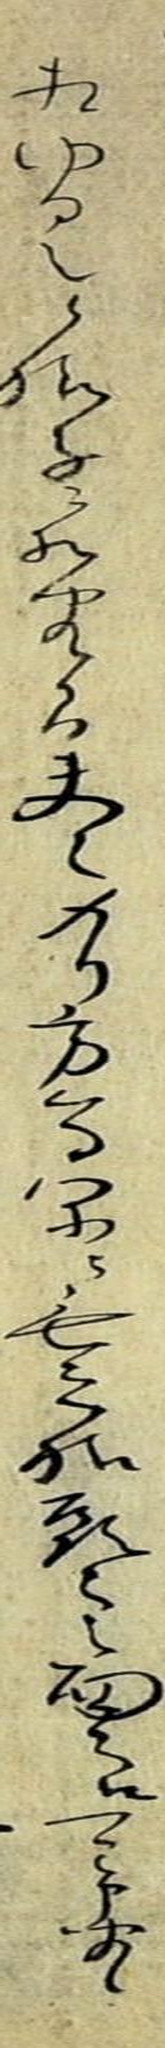相ゆるみ候様子ニ相聞候間夫々〆り方等閑ニ無之様頭々之面々江可被申聞候
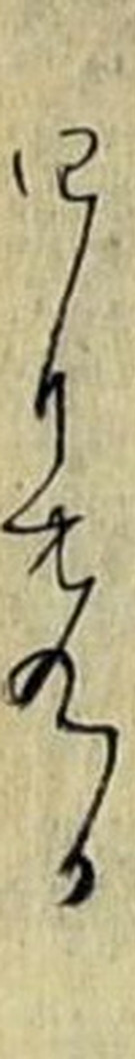四月廿九日
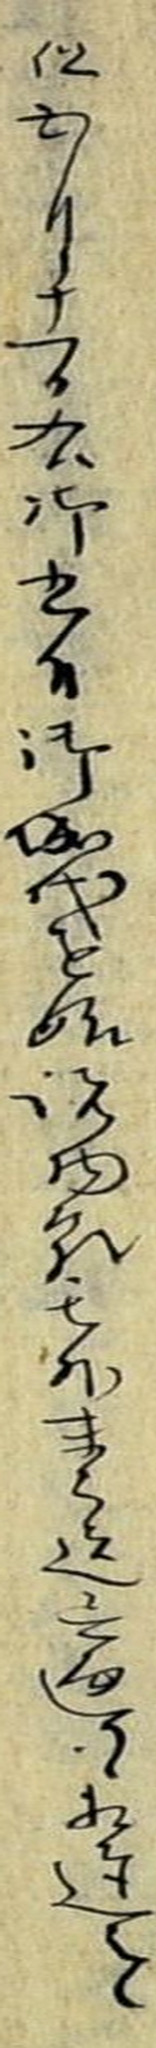但五月十一日右書付御城代を始諸物頭其外末々迄壱通ツヽ相達之候
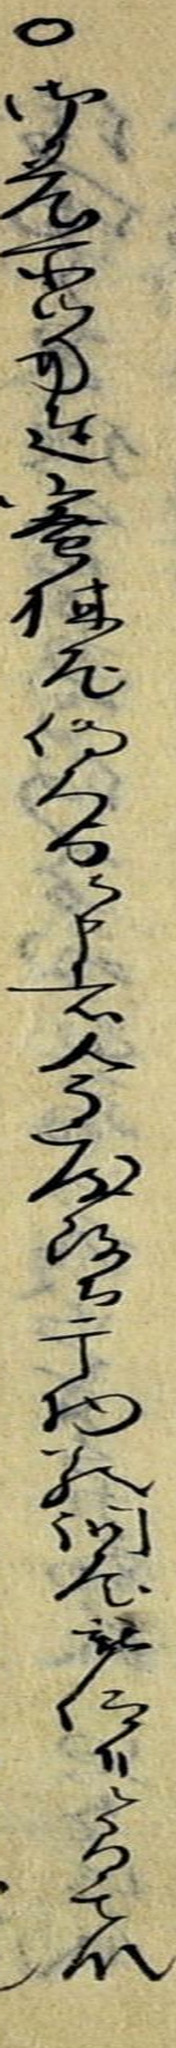〇御台所御用達蜜柑屋伝右衛門与申者今度改而干物類問屋被仰付候間其段
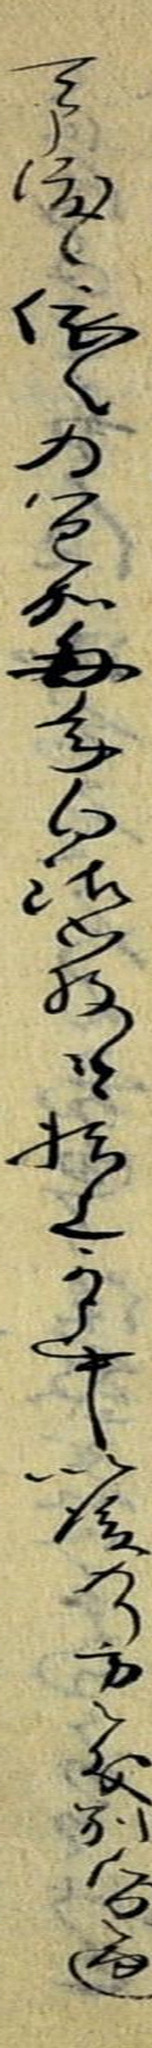可申渡候依之為冥加毎年白銀弐枚ツヽ指上可申事以後〆り方之義別紙之通
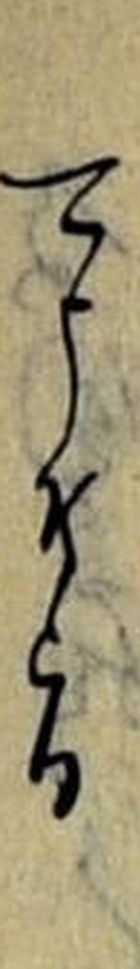可申付旨
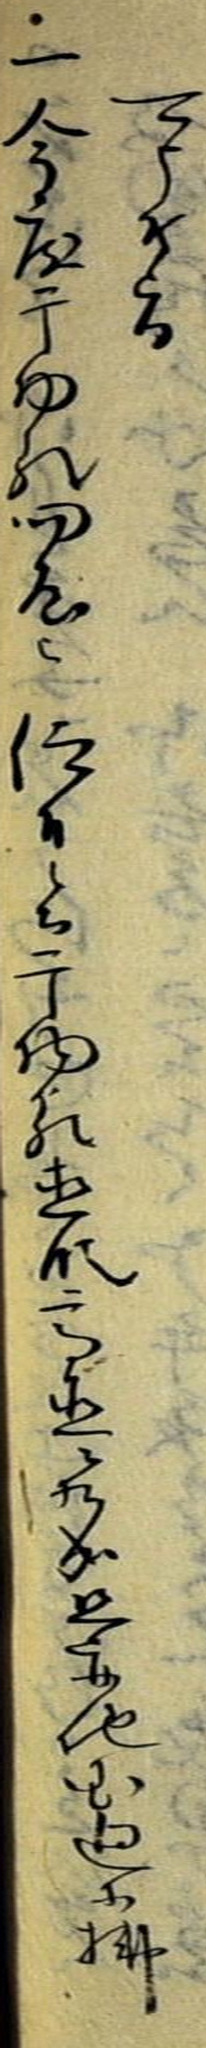一今度干物類問屋被仰付候而干物類直段高直ニ相成且亦他国廻等払
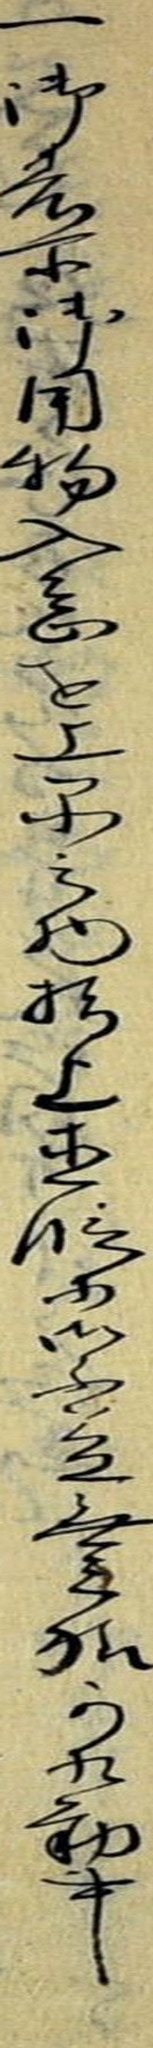一御台所御用物入念を上品之物指上直段等御不益無之様可相勤事
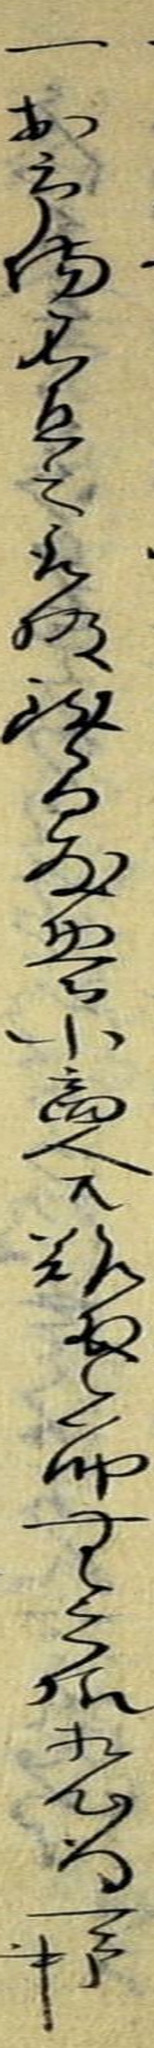一於市場不宜之取扱致間敷惣而小商人共難義之筋無之様相心得可申事
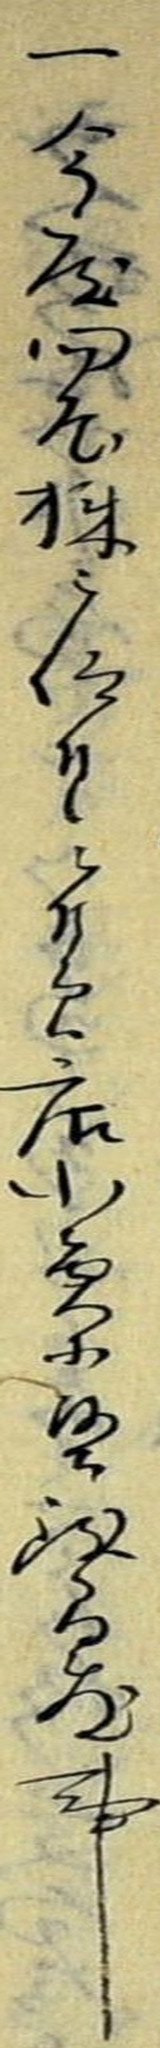一今度問屋株被仰付候ニ付而ハ店小売等堅致間敷事
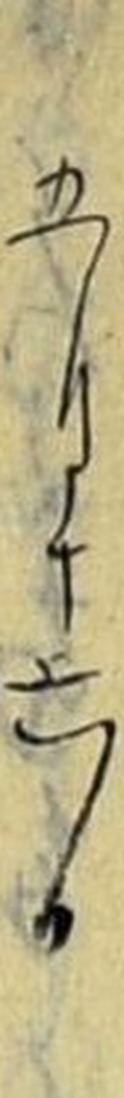五月十六日
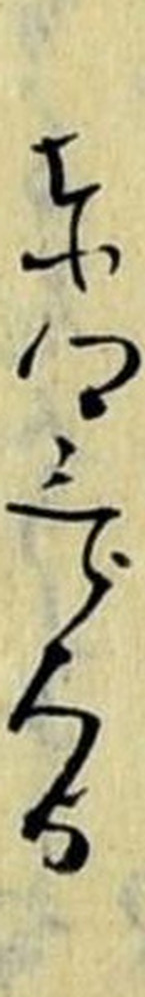東郷三郎右衛門
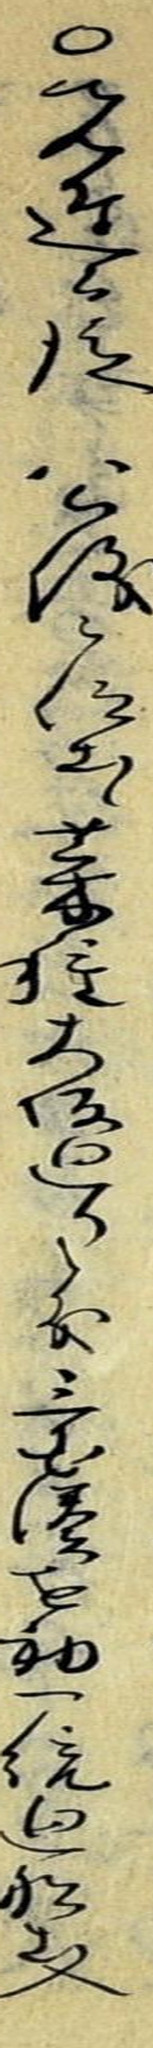〇先達而従公儀被仰出候菜種大坂廻り之義三国湊を初一統廻船出入
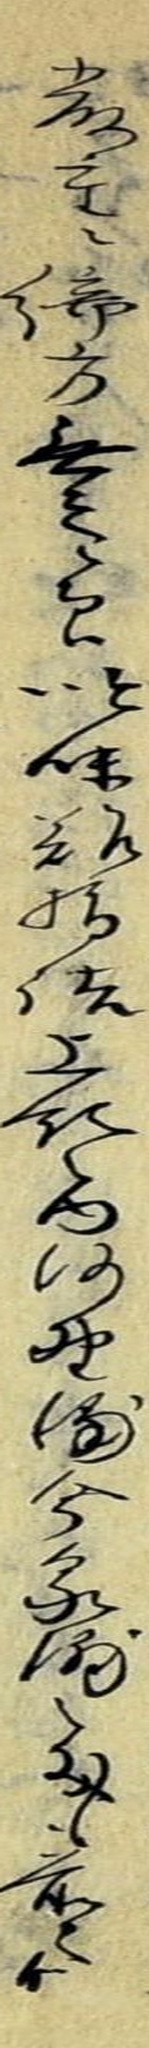厳重ニ締方無之候而ハ吟味難指詰上領之内河野浦今泉浦之義も前々ゟ
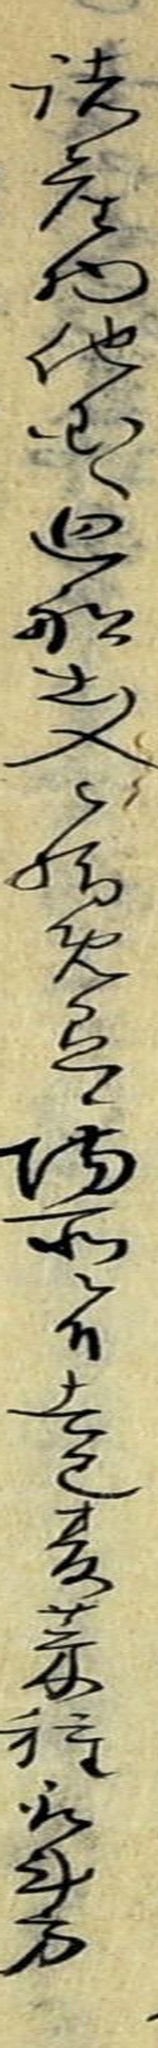諸産物他国へ廻船出入被指免置候場所ニ付去巳夏菜種取計方
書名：命令之部 三
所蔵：福井県文書館 Fukui Prefectural Archives
